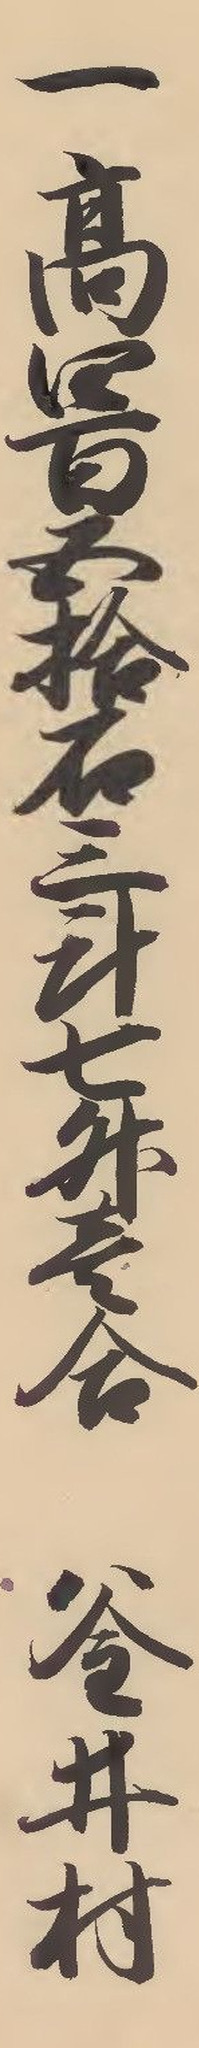一高四百五拾石三斗七升壱合釜井村

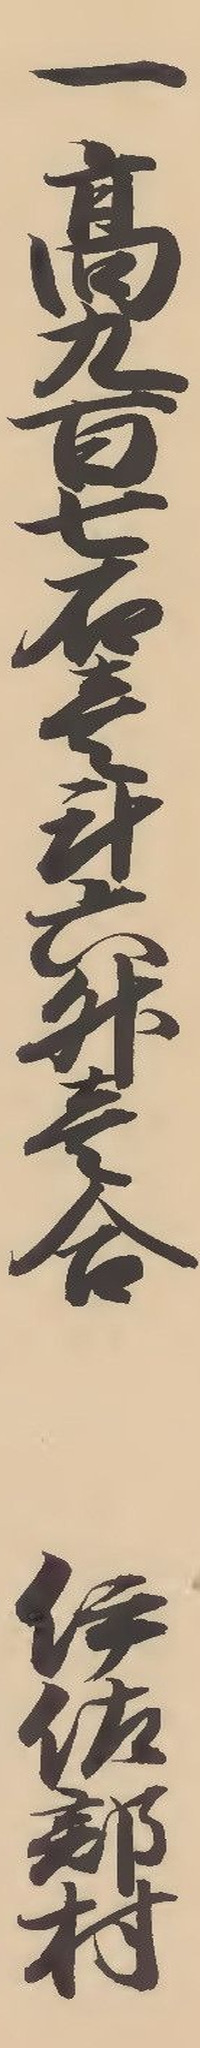一高九百七石壱斗六升壱合伊佐部村
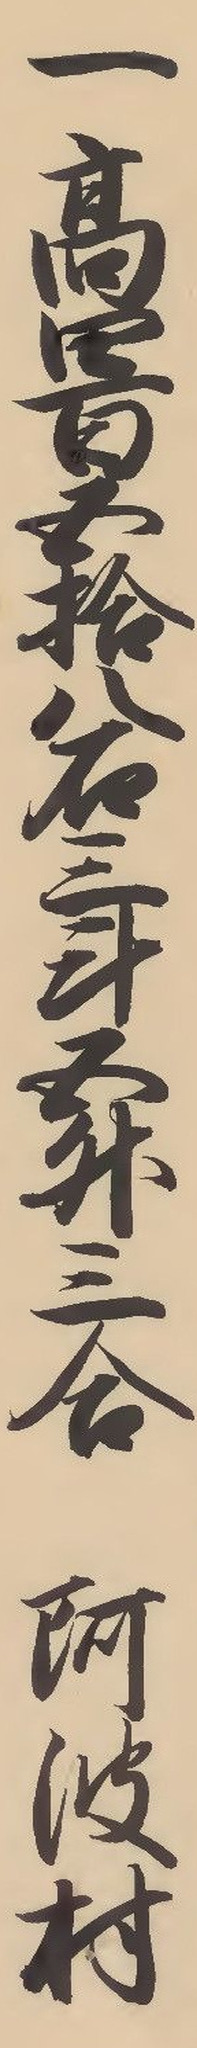一高四百五拾八石三斗五升三合阿波村
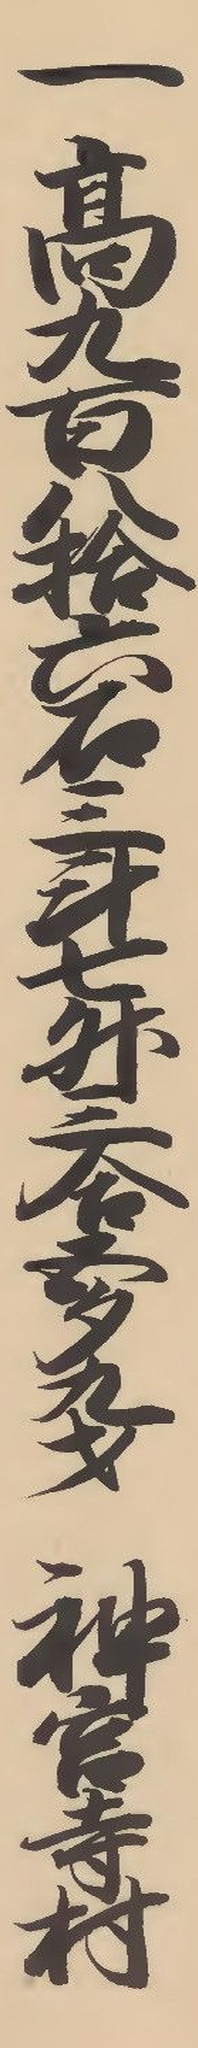一高九百八拾六石三斗七升三合五勺九才神宮寺村
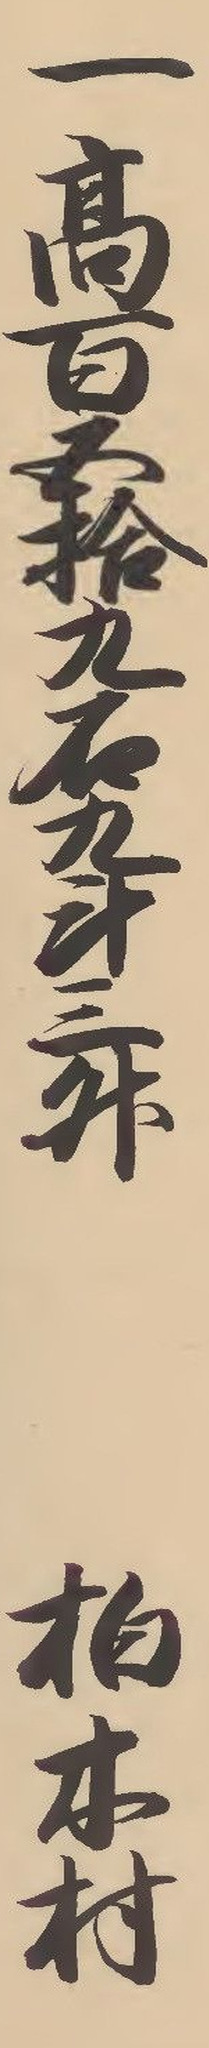一高百五拾九石九斗三升柏木村
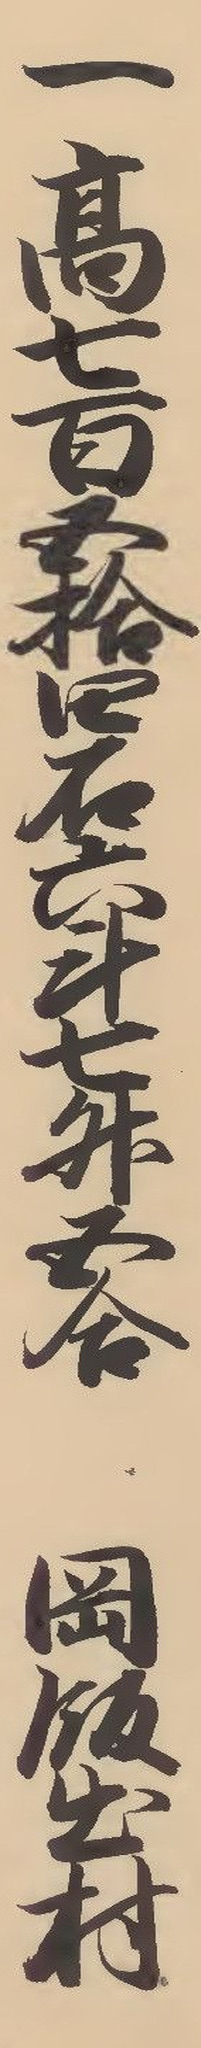一高七百五拾四石六斗七升五合岡飯出村
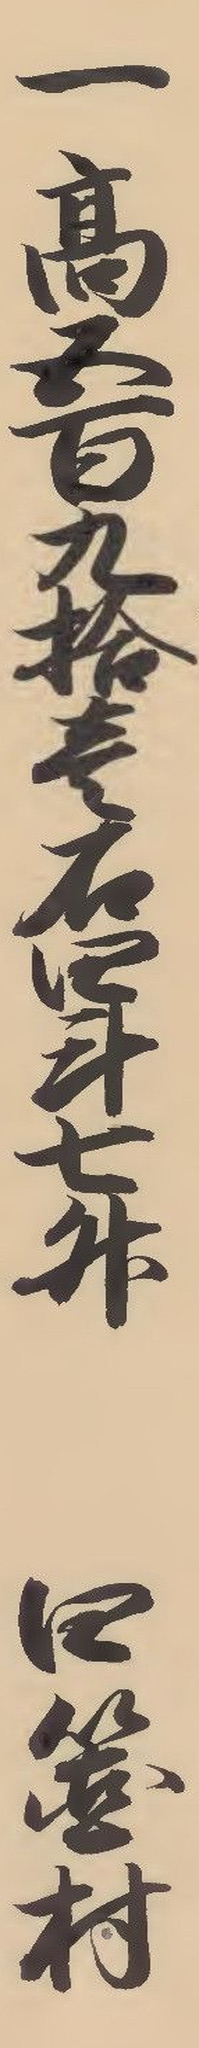一高五百九拾壱石四斗七升四箇村
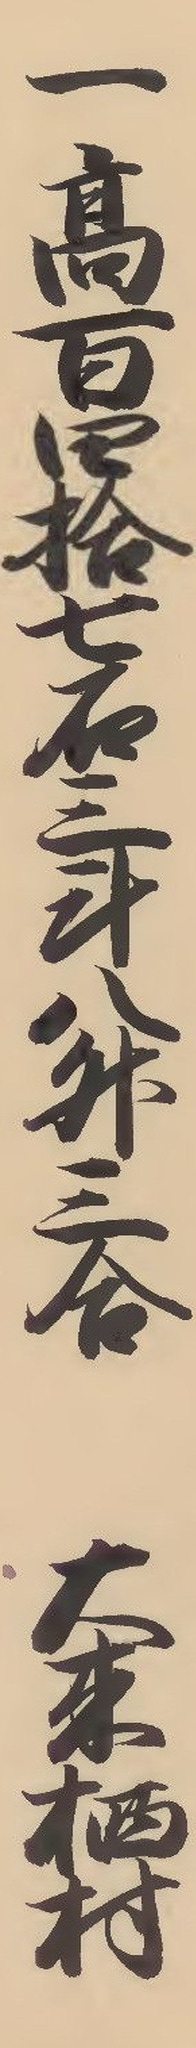一高百四拾七石三斗八升三合大来栖村

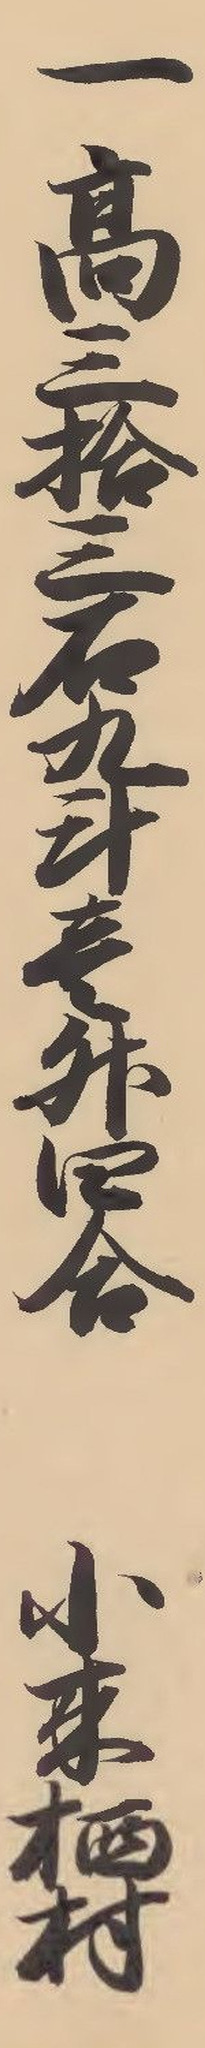一高三拾三石九斗壱升四合小来栖村
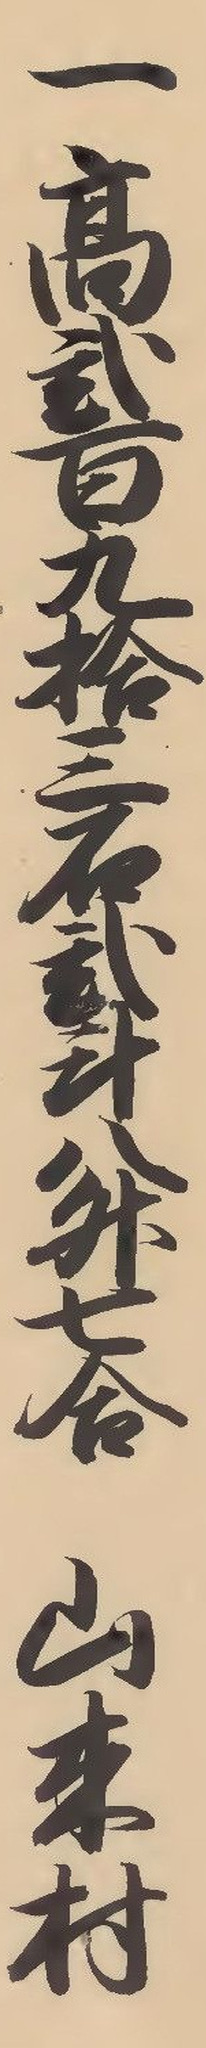一高弐百九拾三石弐斗八升七合山来村
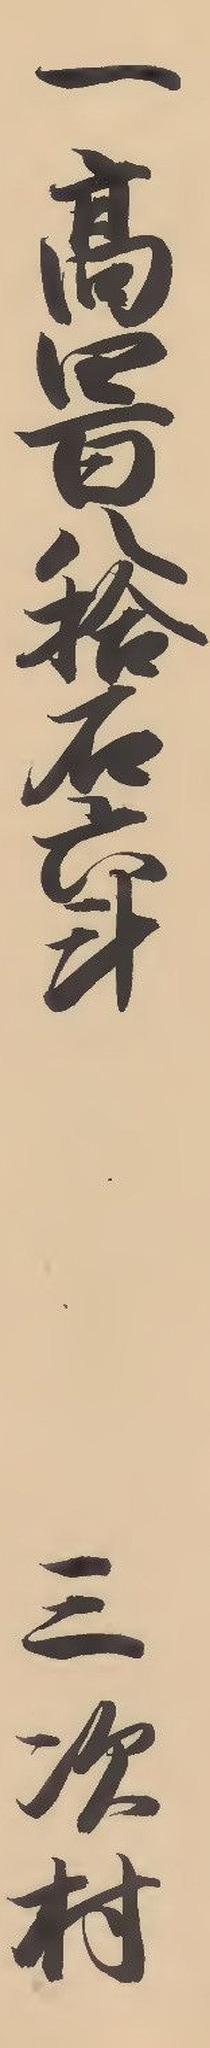一高四百八拾石六斗三次村
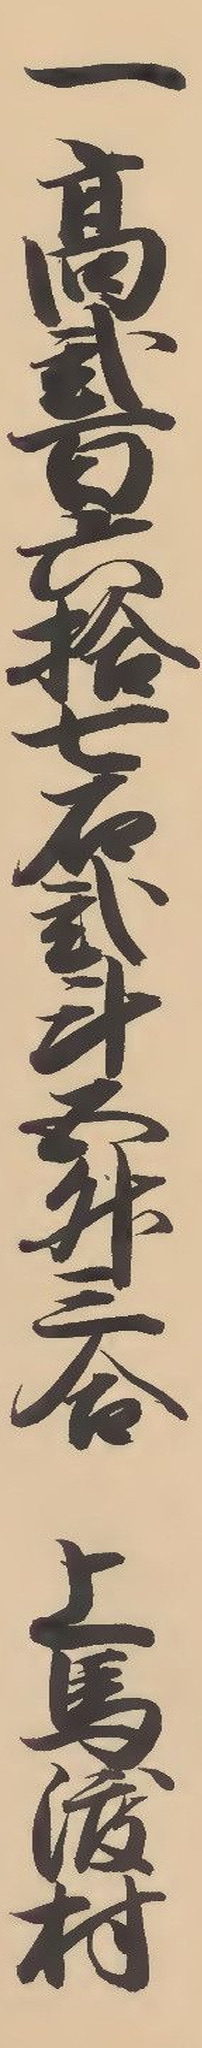一高弐百六拾七石弐斗五升三合上馬渡村
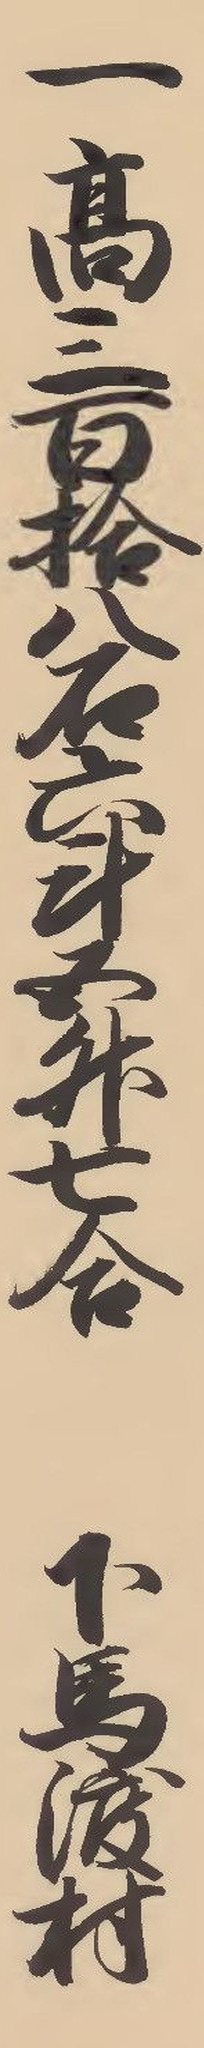一高三百拾八石六斗五升七合下馬渡村
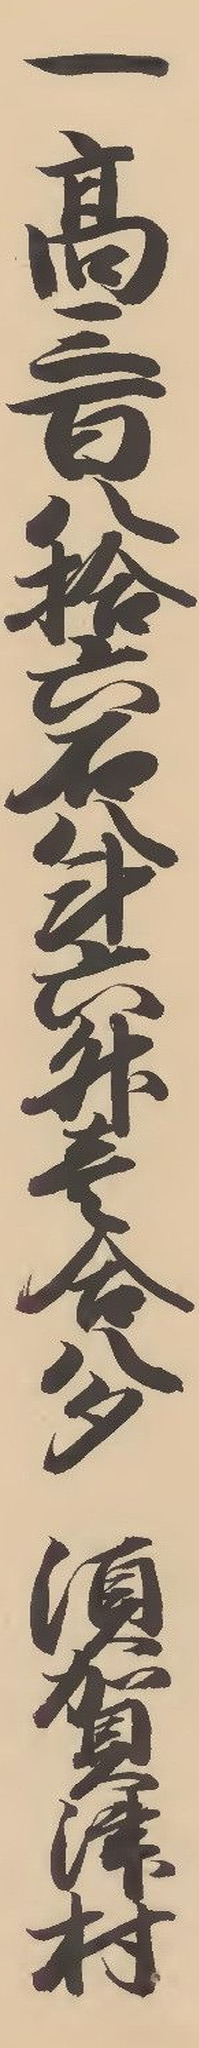一高三百八拾六石八斗六升壱合八勺須賀津村
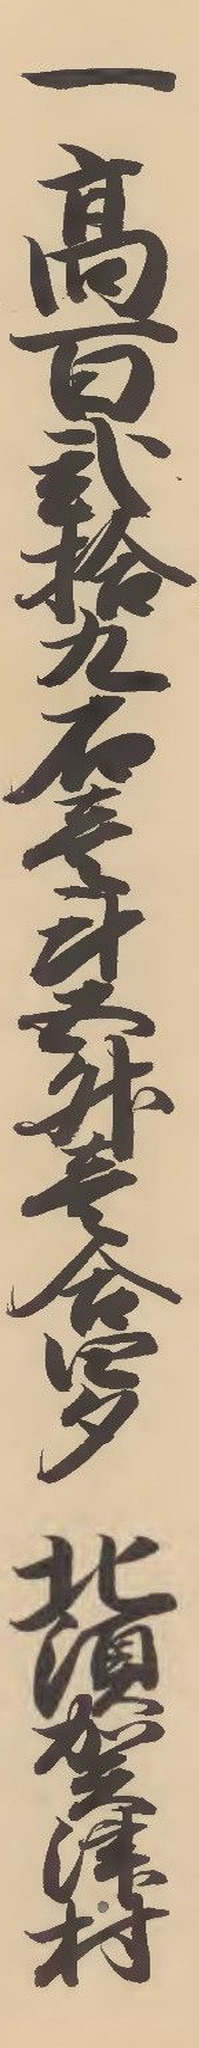一高百弐拾九石壱斗五升壱合四勺北須賀津村
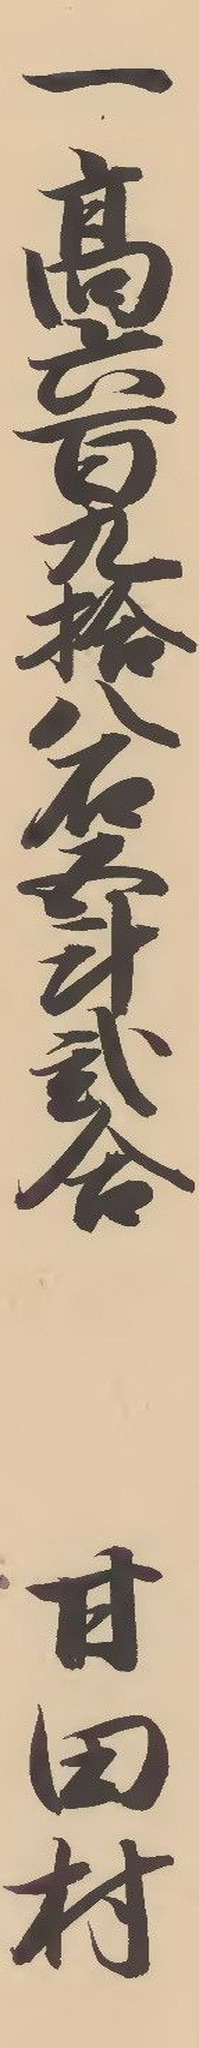一高六百九拾八石五斗弐合甘田村
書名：常陸国郷帳
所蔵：国立公文書館 National Archives of Japan
